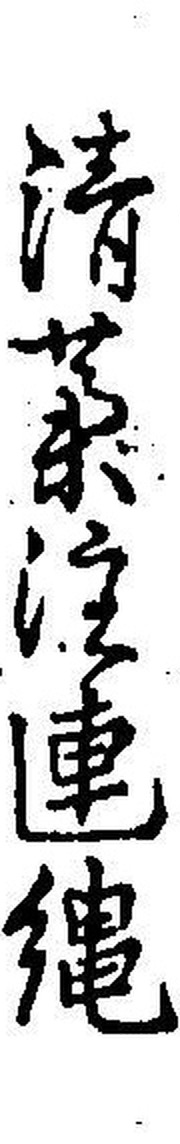清藁注連縄
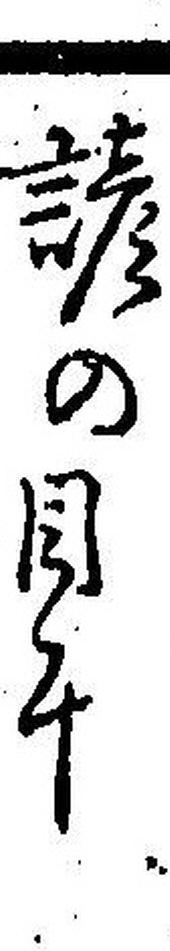諺の目に
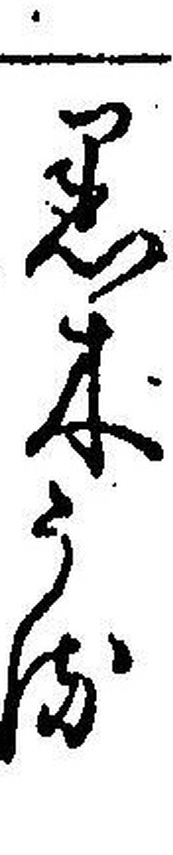黒木うる
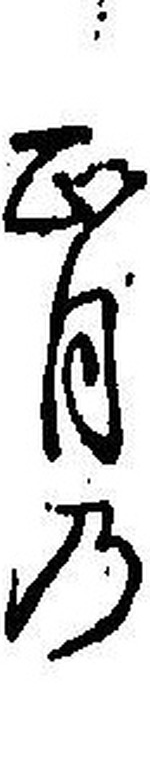正月の
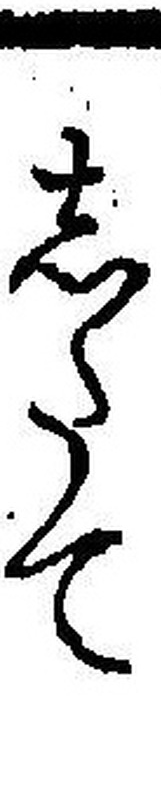したて
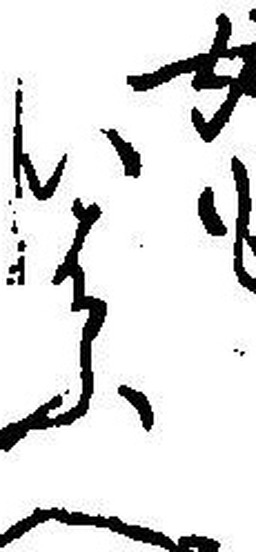いはふ
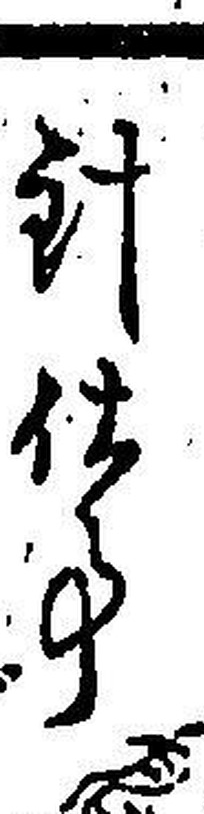針仕事
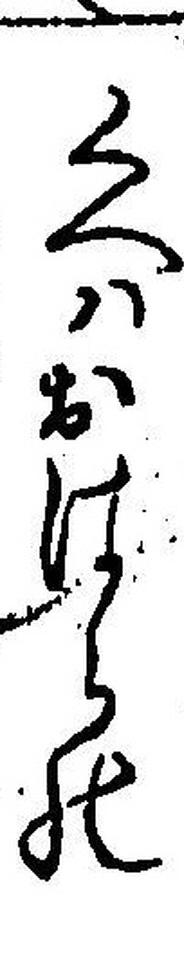くへはおはらの
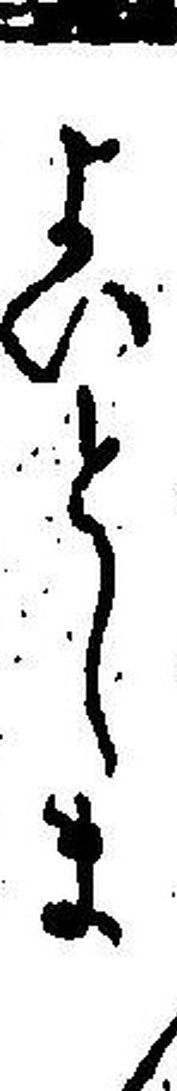よいとしま
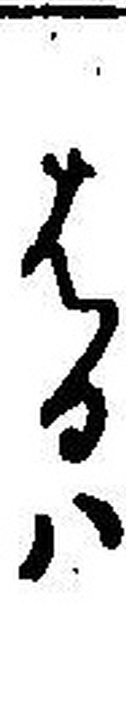はるは
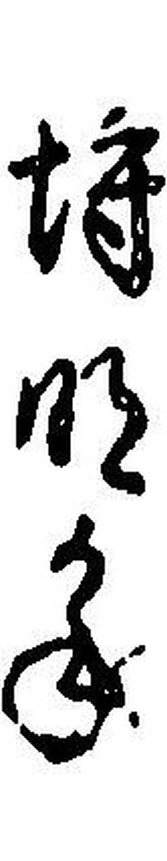埓明かね
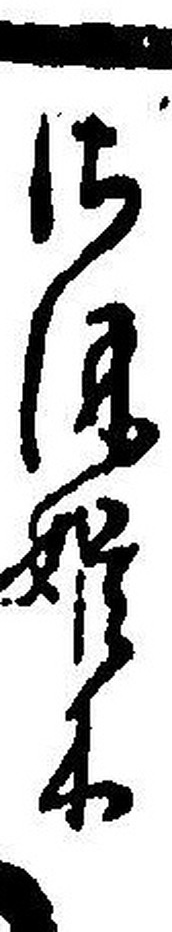さほ姫に
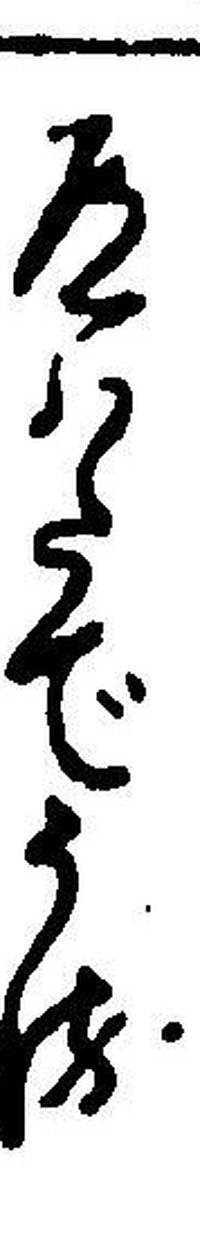道はたでうる
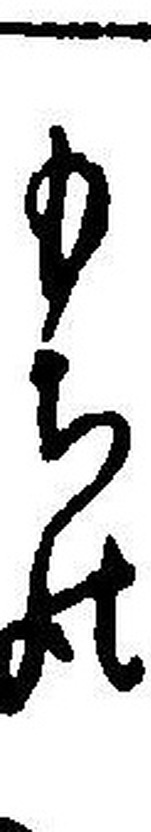もちの
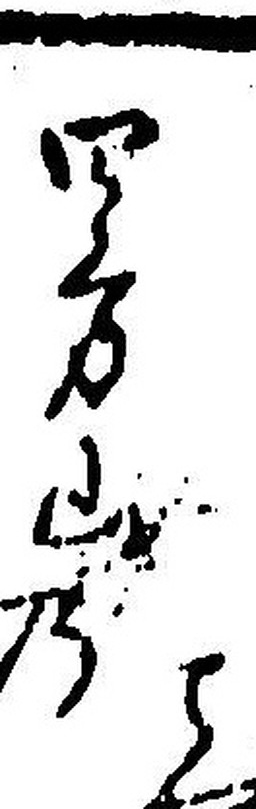四方山の
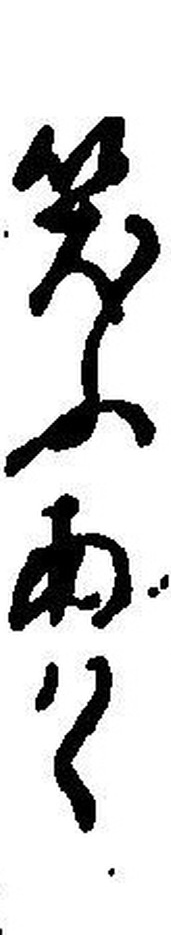笑ふあはゝ
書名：どうれ百人一首 / 鹿都部真顔(狂歌堂)編
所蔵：東京大学総合図書館 General Library in the University of Tokyo, JAPAN
